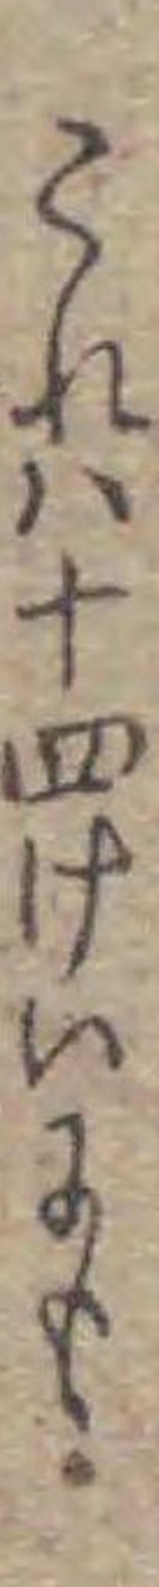これは十四けいにも
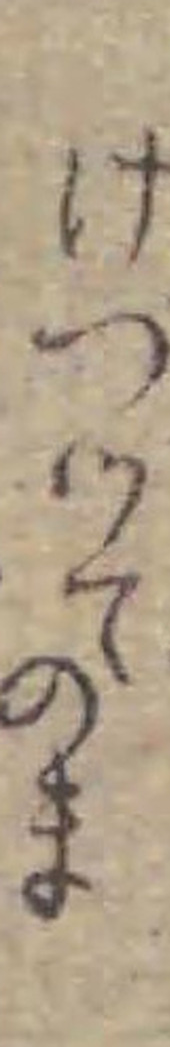けづつてのませ
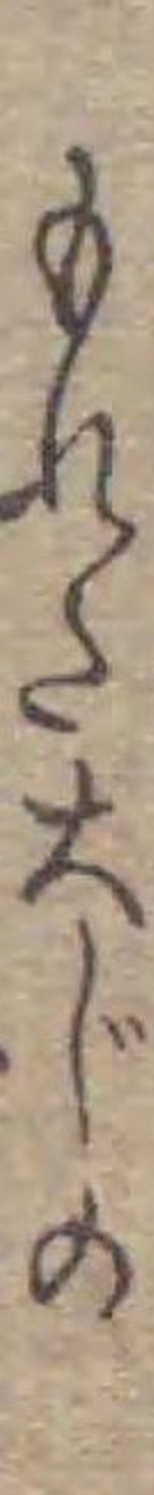もれた大じの
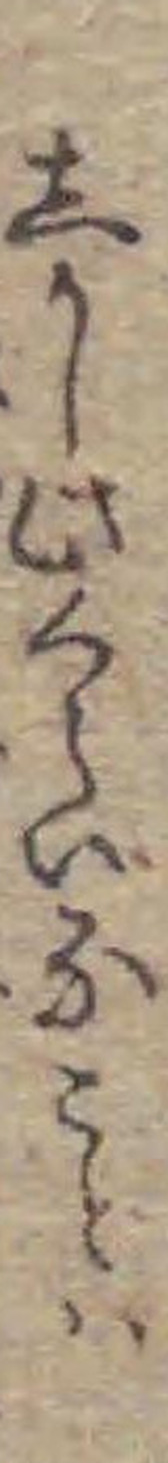しかし此くらいなことは
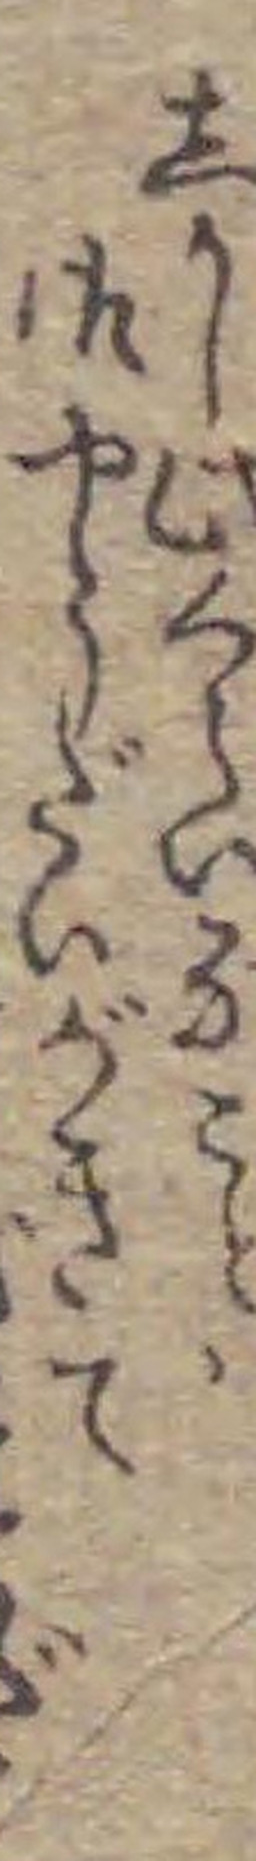御やうだいがきて
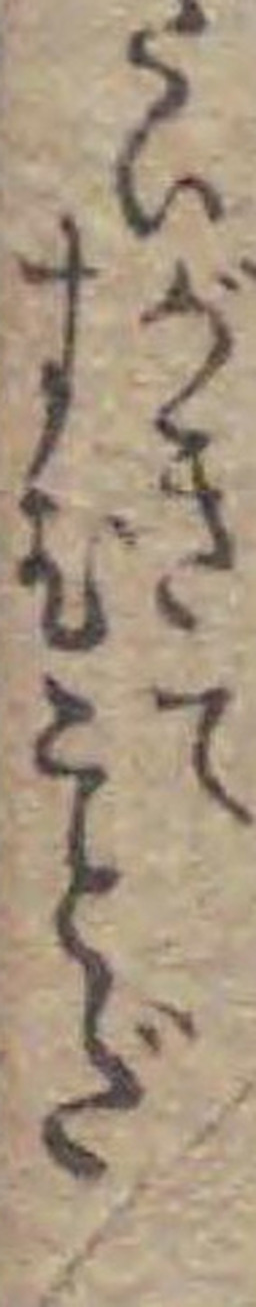すむことだ
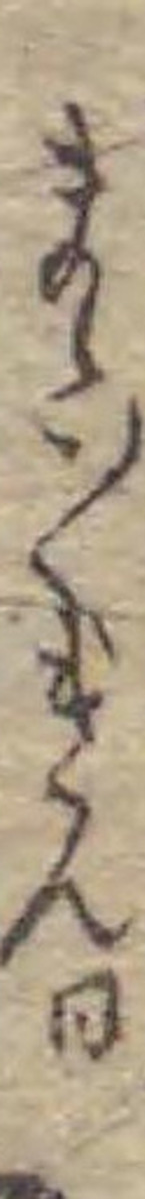また〳〵きん日
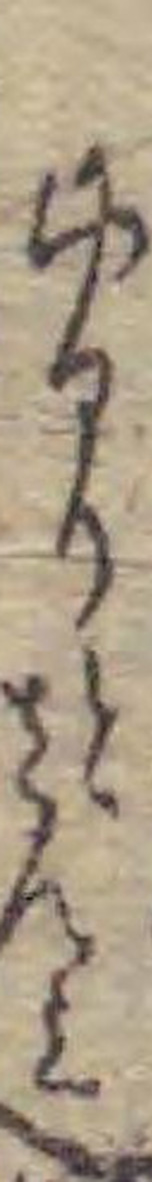ゆるりとさん上
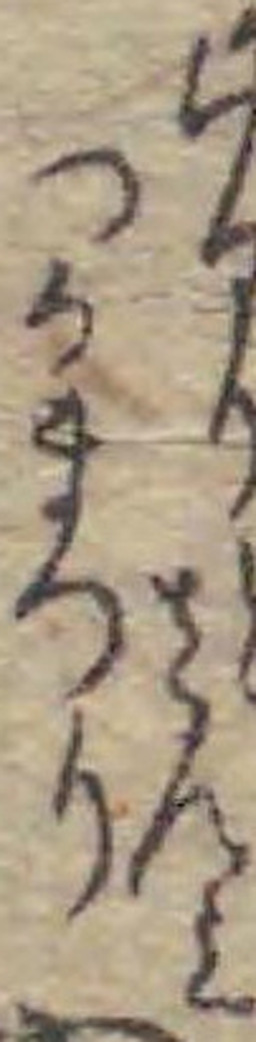つかまつり
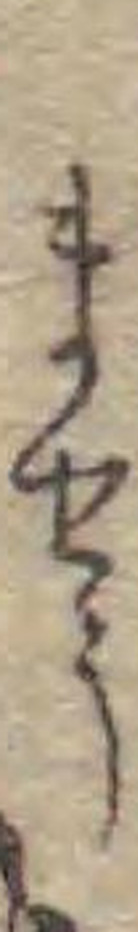ませう
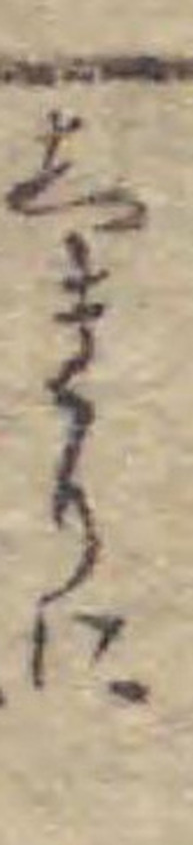しきりに
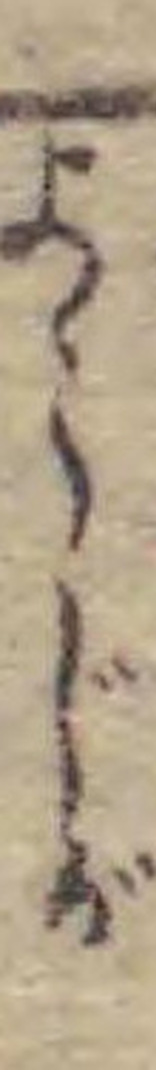ようじが
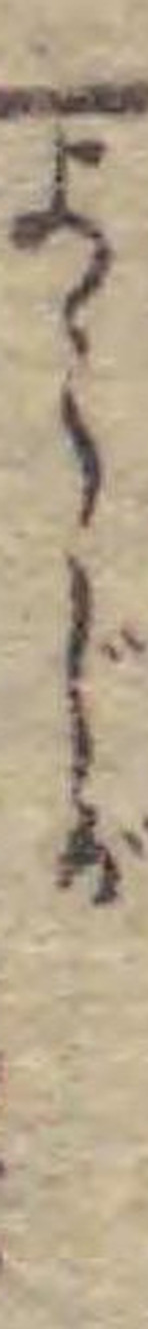ようじが
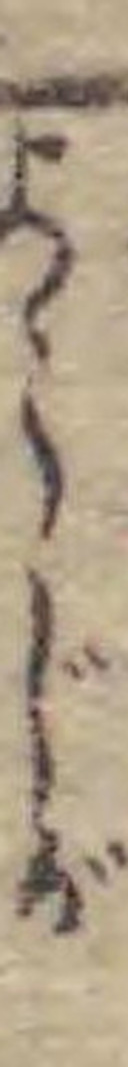ようじが
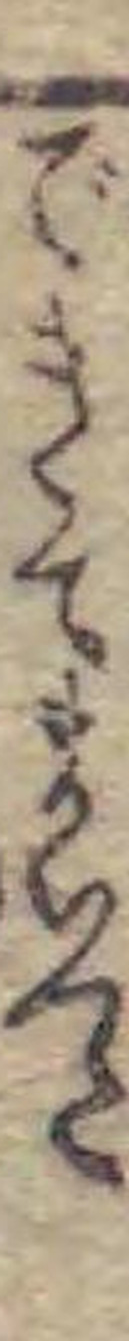できてまいつた
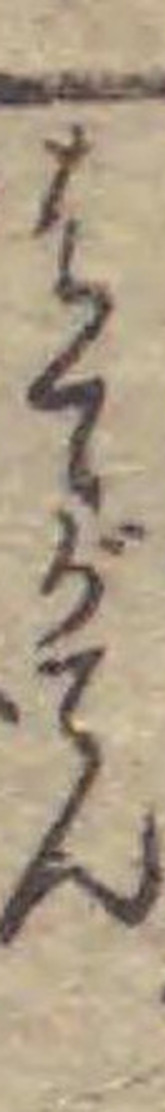はてがてん
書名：江戸花俳優贔屓 : 3巻
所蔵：国立国会図書館 National Diet Library, JAPAN
